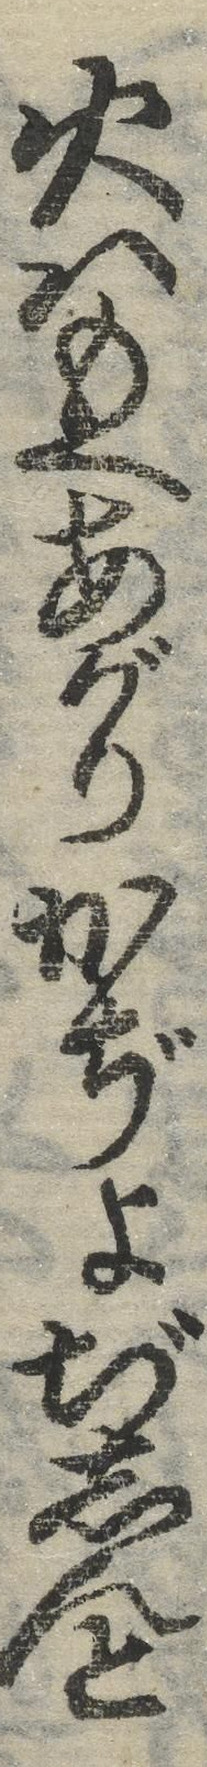火はもへあがりかぢよぢしんと
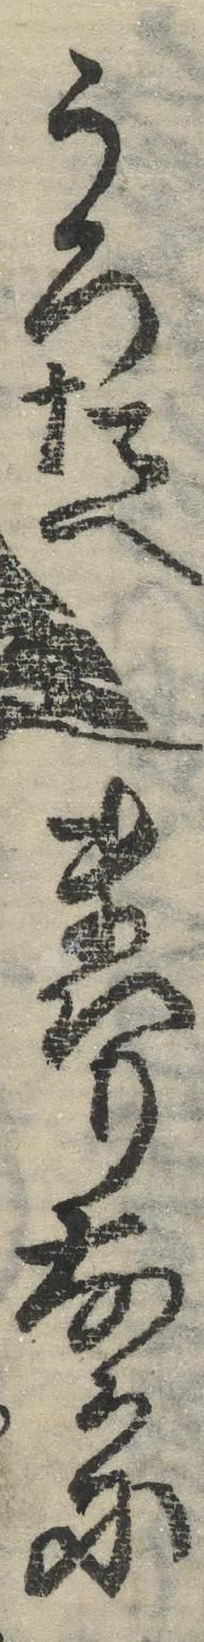うろたへまはりなかに
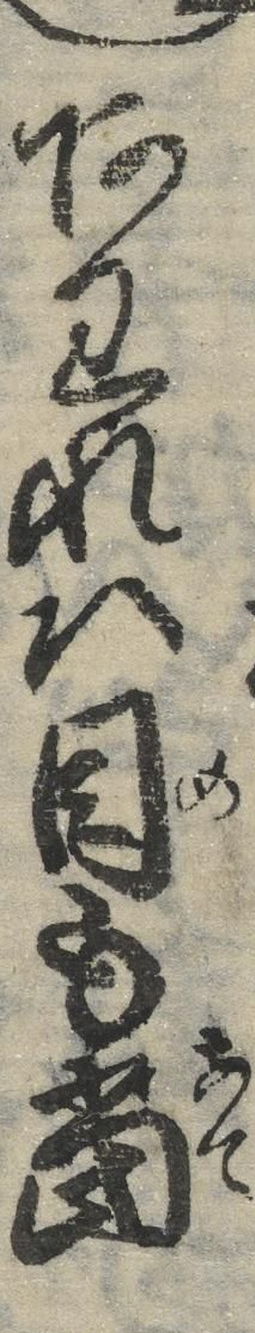あわれは目も当
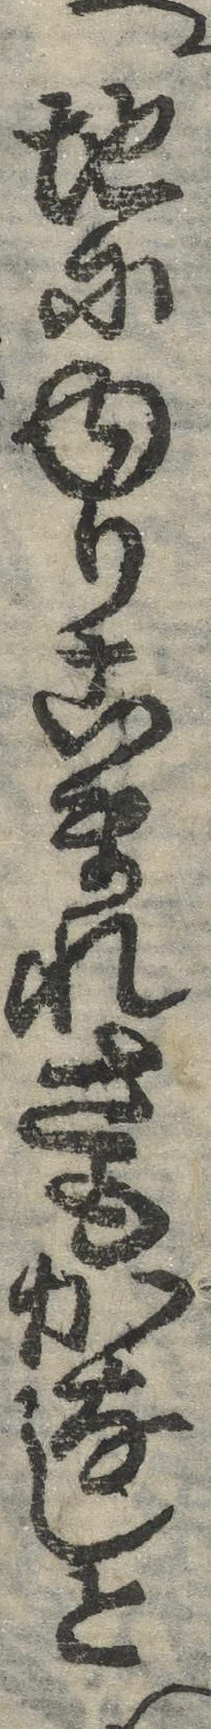山地にゆくこまれさもかなしと
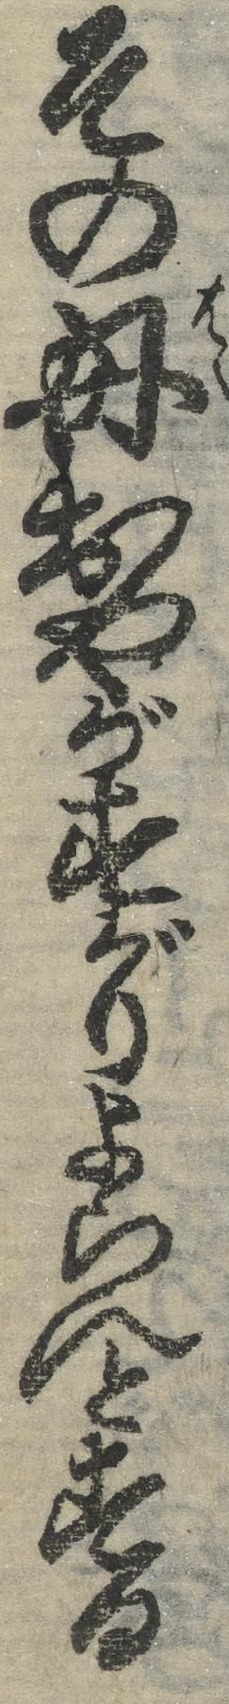その母おやがすがりよらんとする

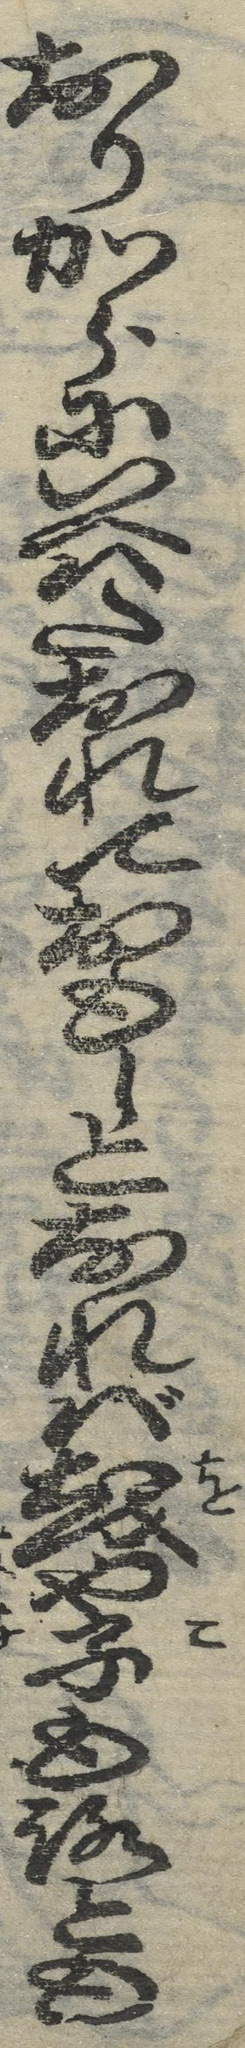おりからにいへはたおれておもしとなれば親や子もろとも
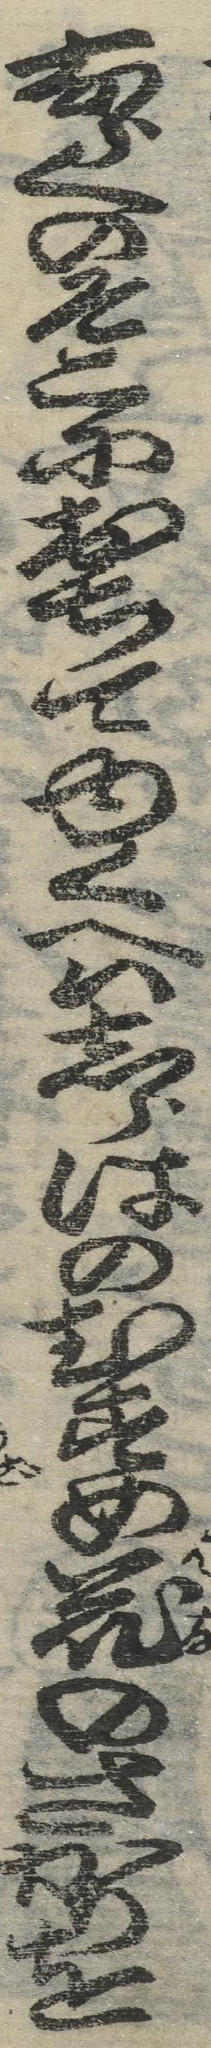ならくのそこにおちてゆくへはしらはのむすめ花のさかりを
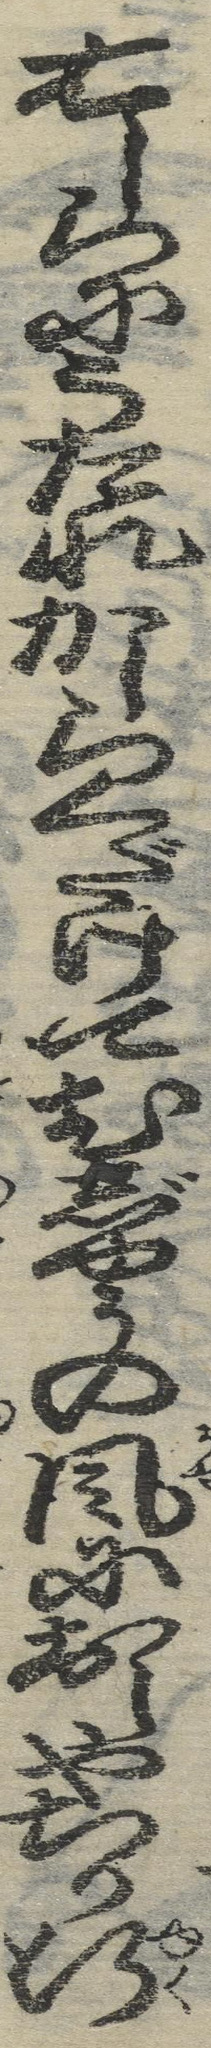はしらにうたれかしらくだけてむじやうの風におしやちり行
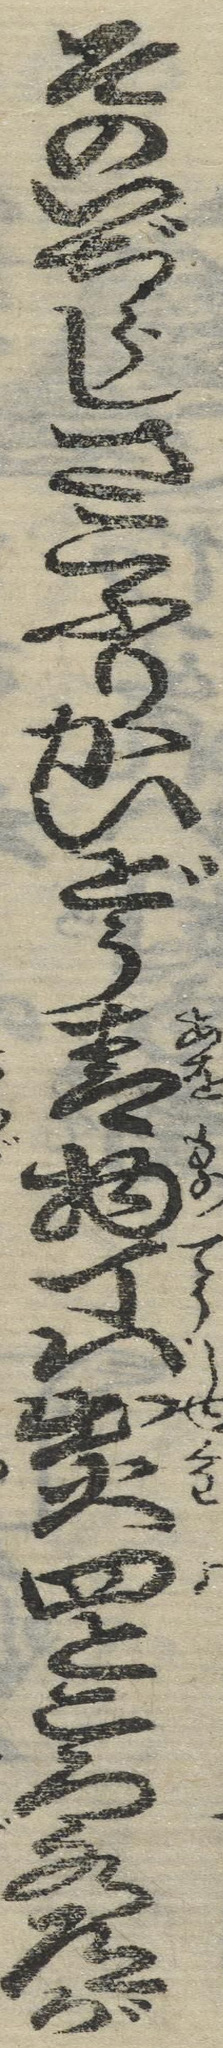そのいぢらしさこふりかいどう青物丁は出火四ところ水屋が
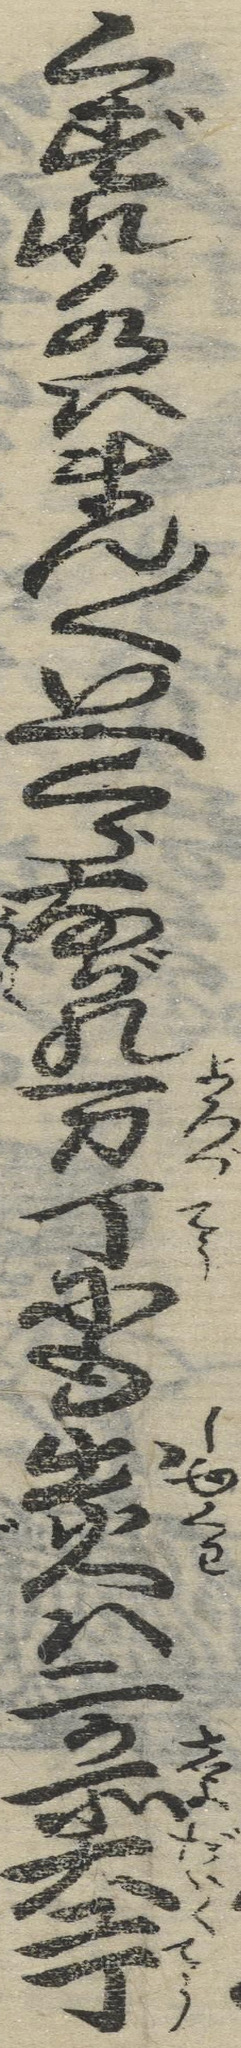くずれ水はまん〳〵いへくらながれ万丁にも出火は二か所大工丁
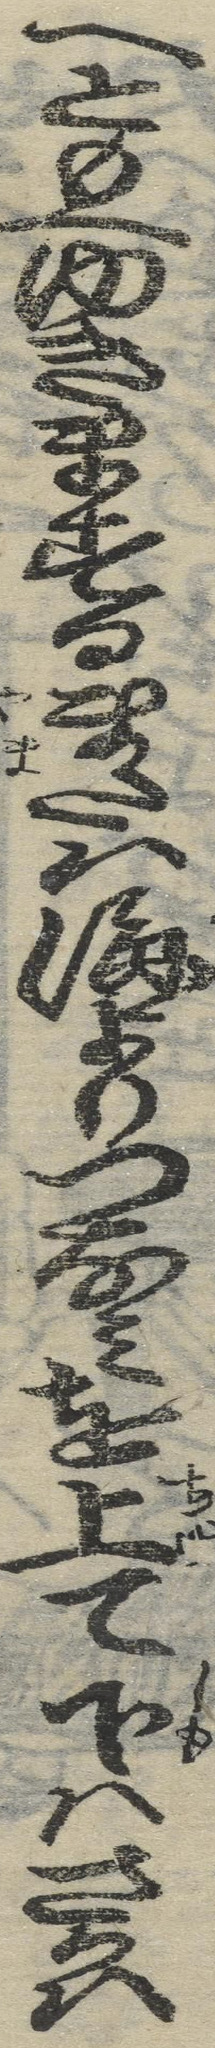へともへゆきまするまたは海よりつなみを上て下はさかは
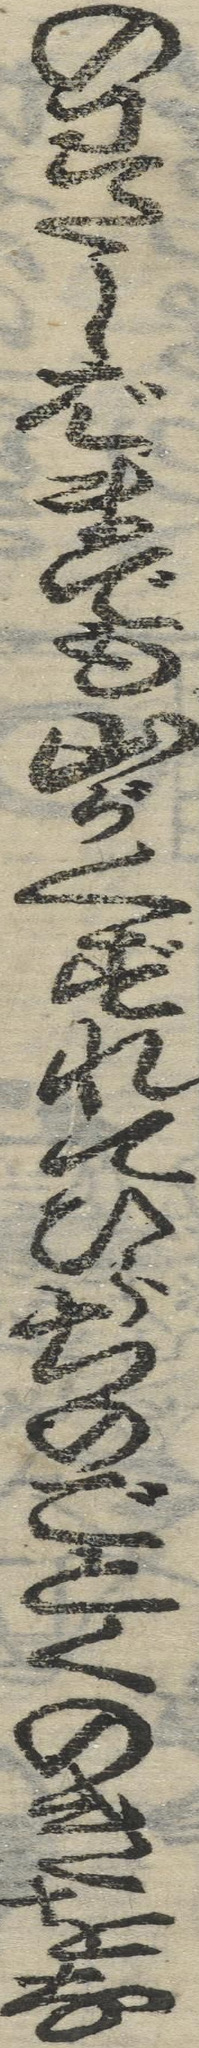のわたしばまでも山がくずれてひらちのごとくのきをな
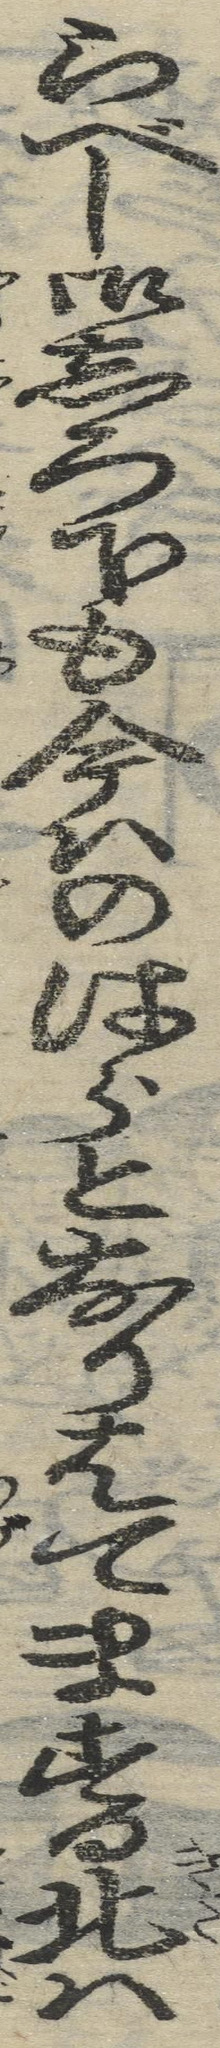らべし御しろ下も今はのはらとなりはてまする北は
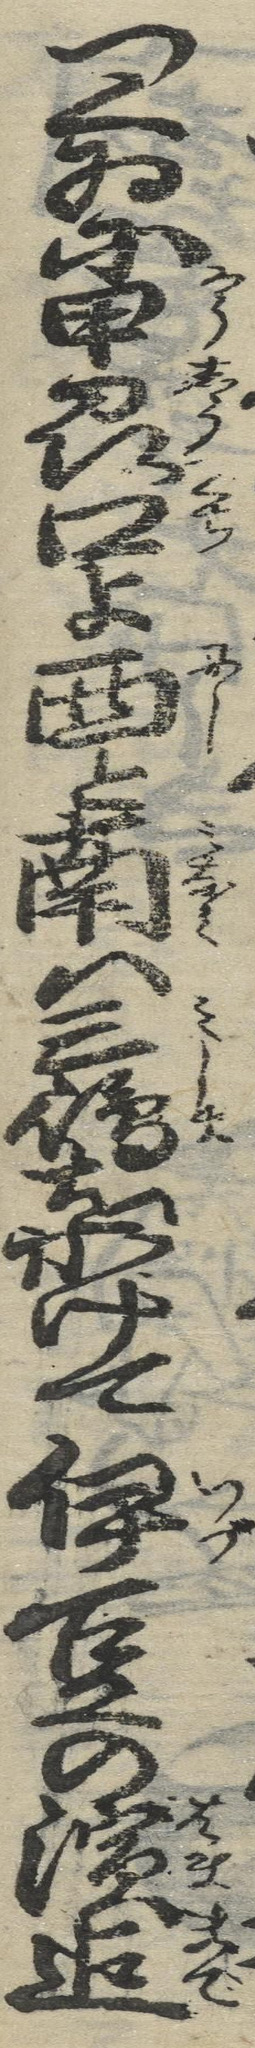つくゐに甲州口よ西と南は三嶋をにけて伊豆の濱迄
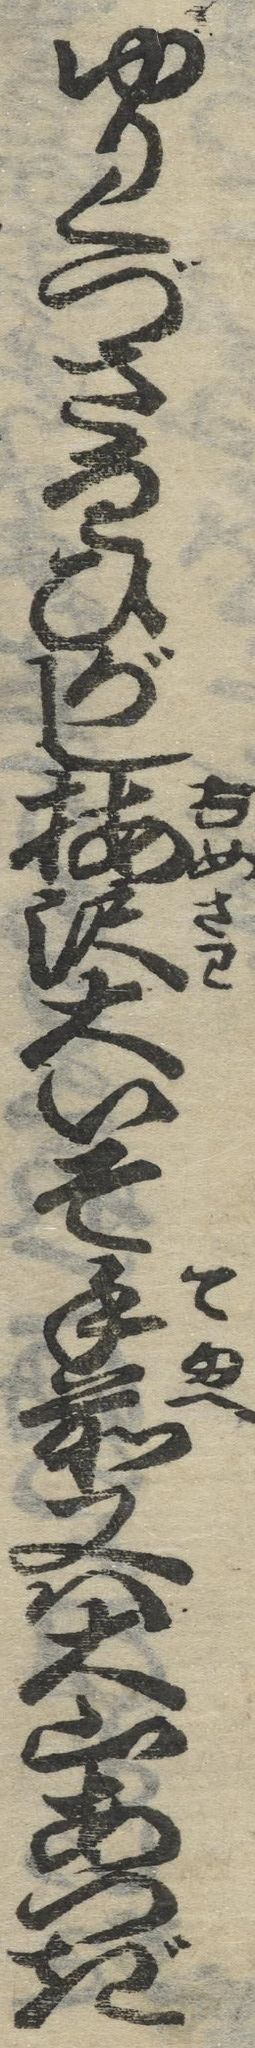ゆりくづさるゝひがし梅沢大いそ手前又は大山あつぎ
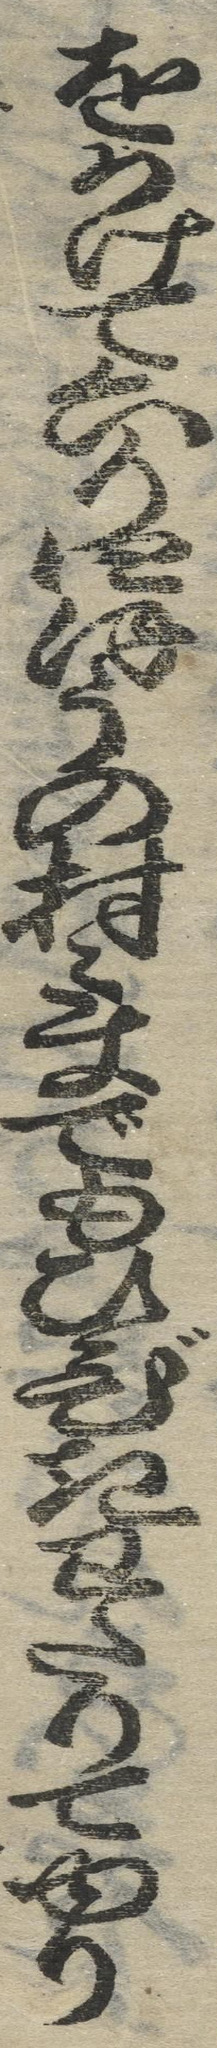をかけて六り四ほうの村〻までもひびきわたりてゆり
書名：相州小田原箱根地震くどき
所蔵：東京大学地震研究所図書室 Earthquake Research Institute Library, The University of Tokyo, JAPAN
